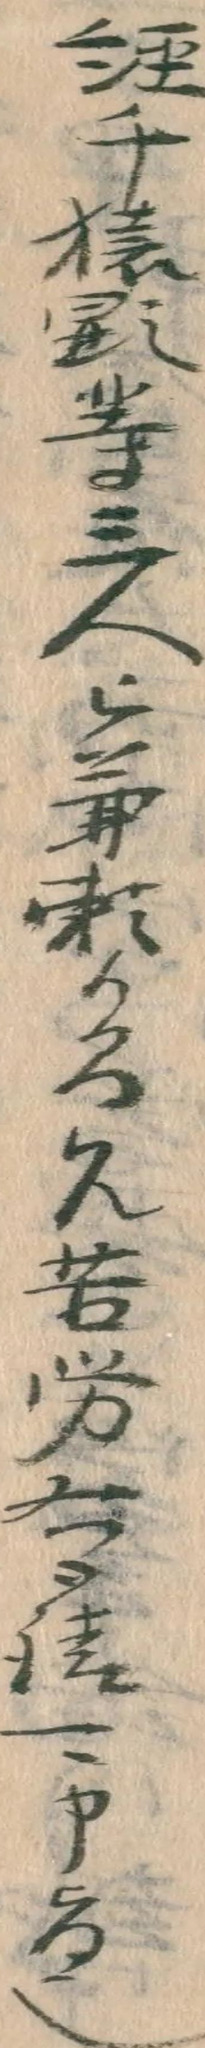経千猿顕等三人被兼頼間乍苦労右御請可申旨也
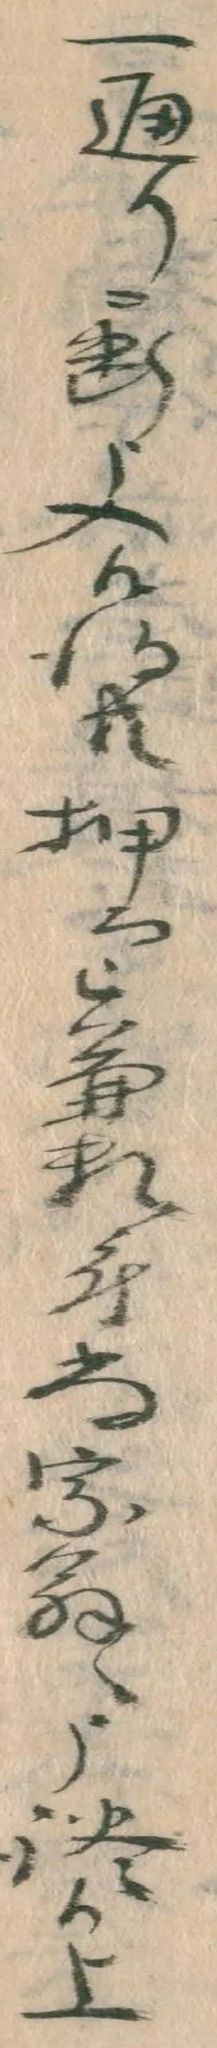一通りニ断申入候得共押而被兼頼候付尚家翁へ申談候上
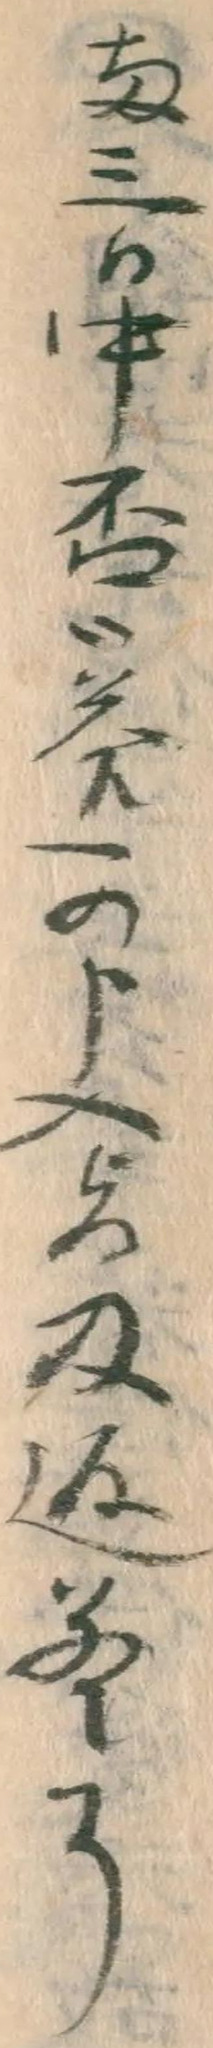両三日中否御答可申入旨及返答了
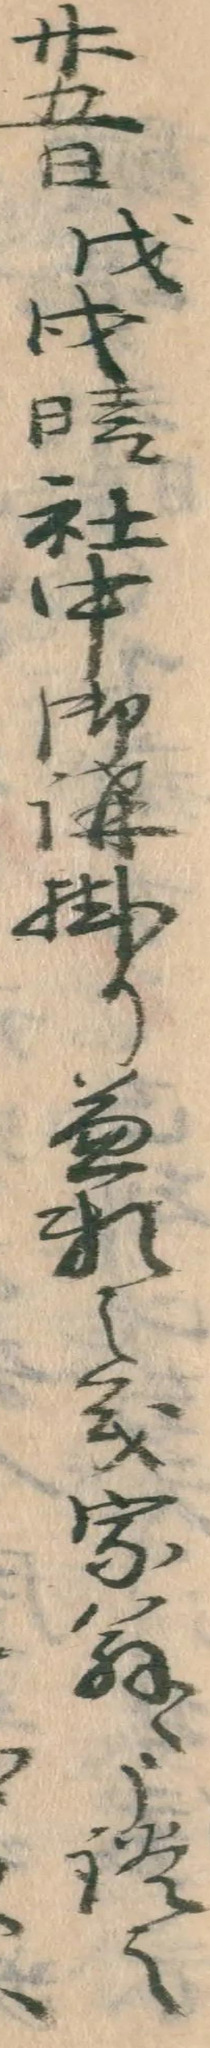廿五日戊戌晴社中御講掛り兼頼之義家翁へ申談之
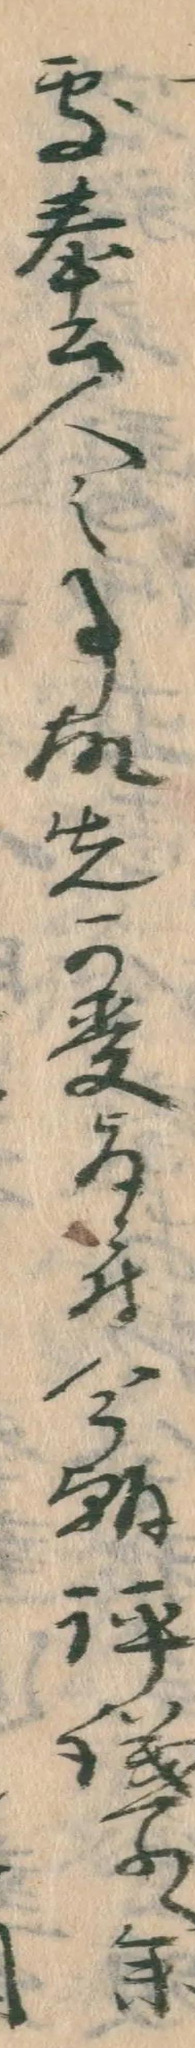處奉公人之事故先可受候に付今朝評議所ヘ参
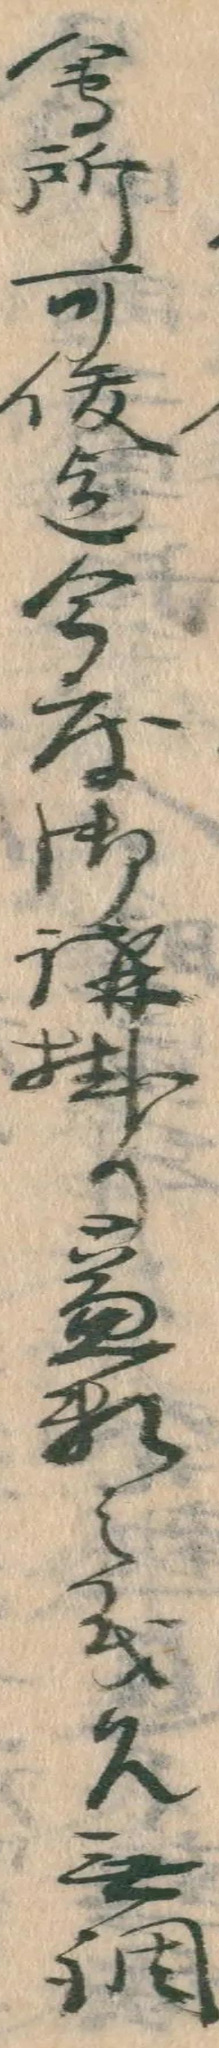會所可俊迄今度御講掛に兼頼之義乍無調
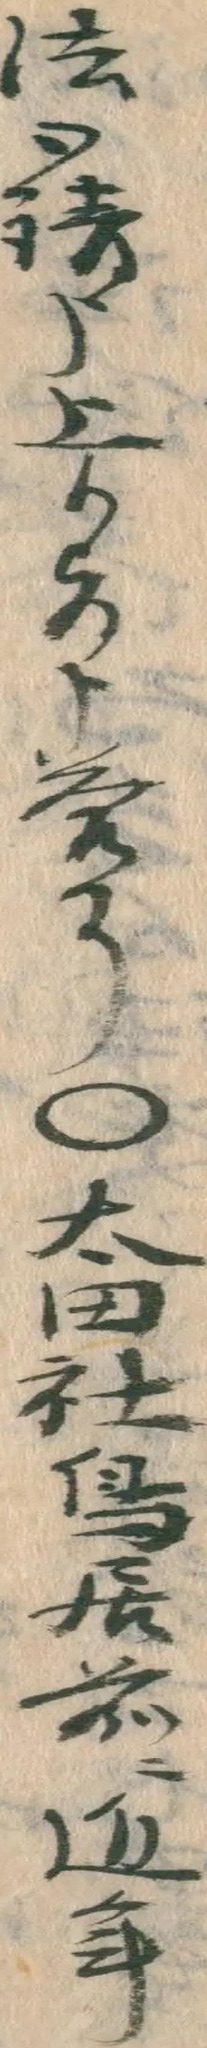法御請申上候旨申答有○太田社鳥居前二近年
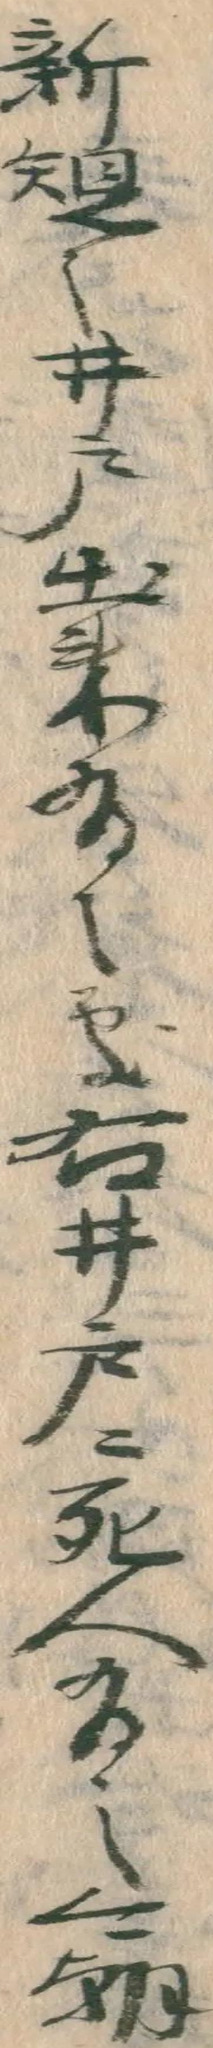新規之井戸出来有之處右井戸ニ死人有之今朝
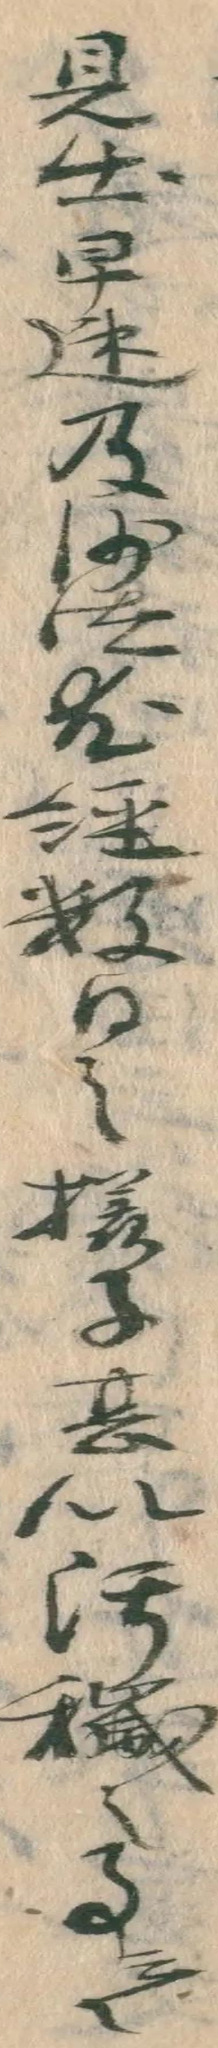見出早速及沙汰尤経数日之様子甚以汚穢之事ニて
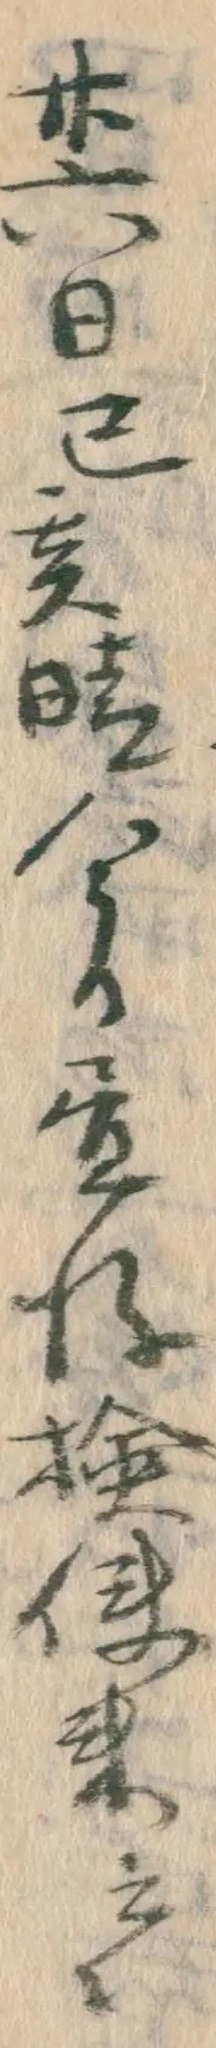廿六日己亥晴今日昼後検使来云々
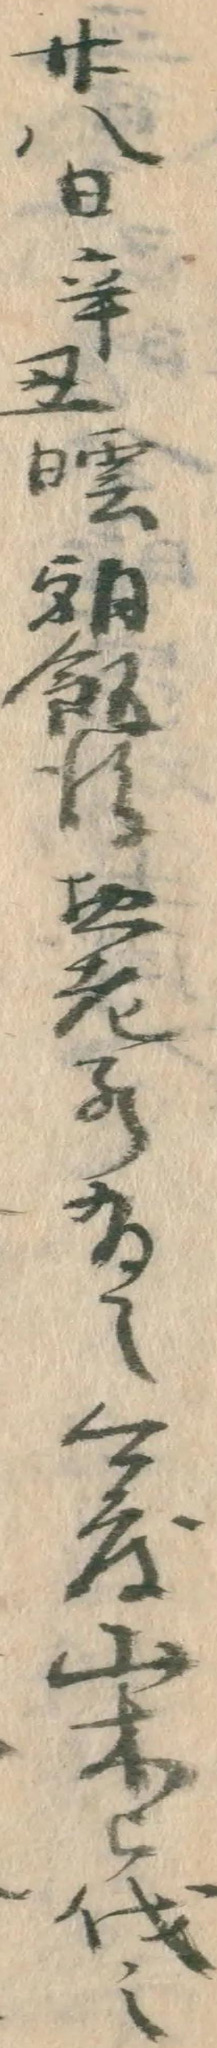廿八日辛丑雲朝飯後惣老若有之今度山木被伐之
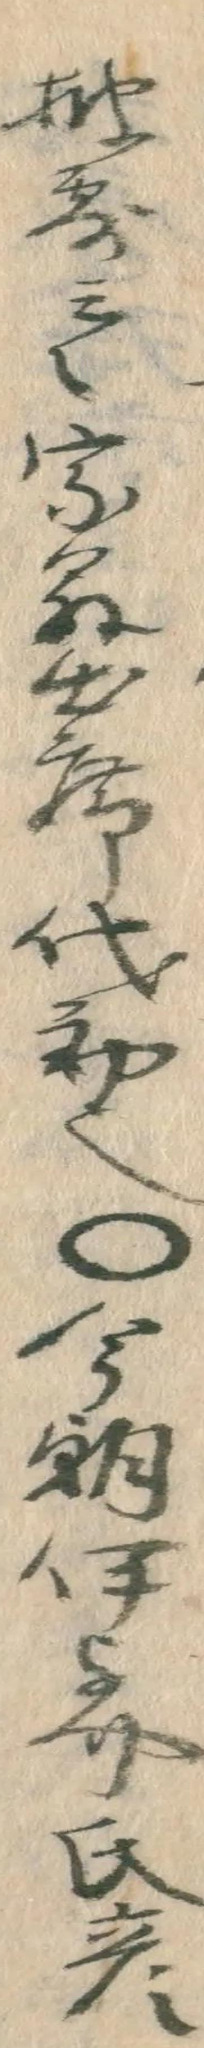披露云々家翁出席代勤也○今朝伊与介氏彦
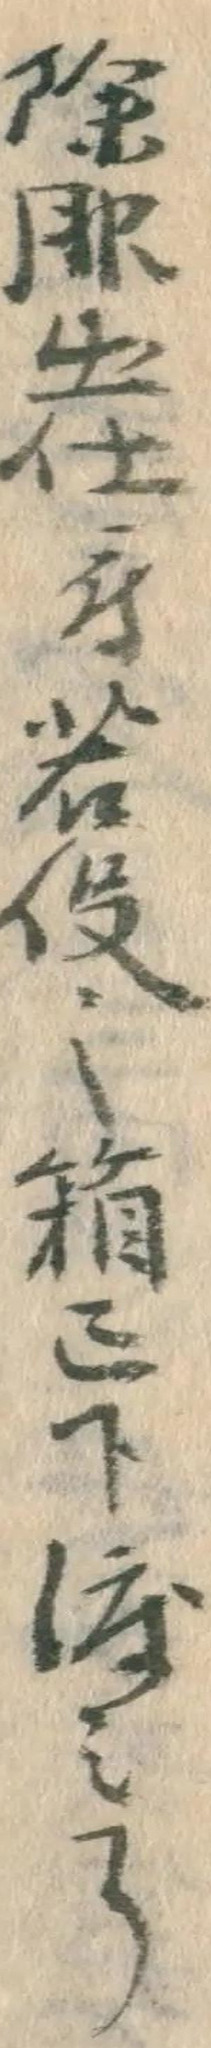除服出仕ニ付若役之箱已下渡之了
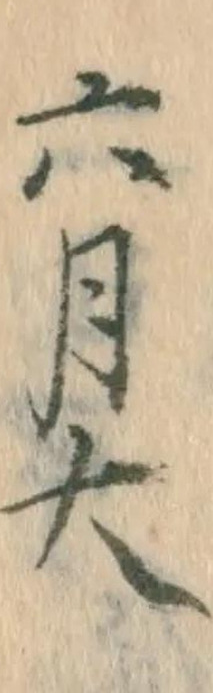六月大

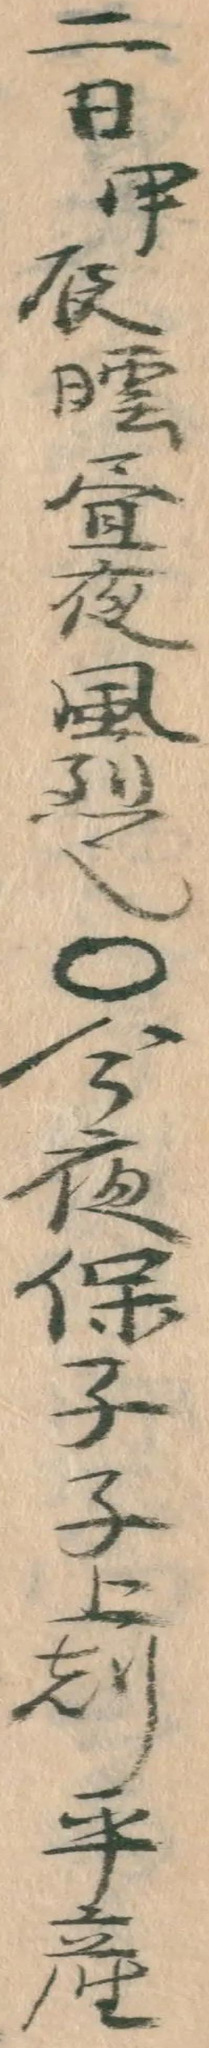二日甲辰曇昼夜風烈也○今夜保子子子刻平産
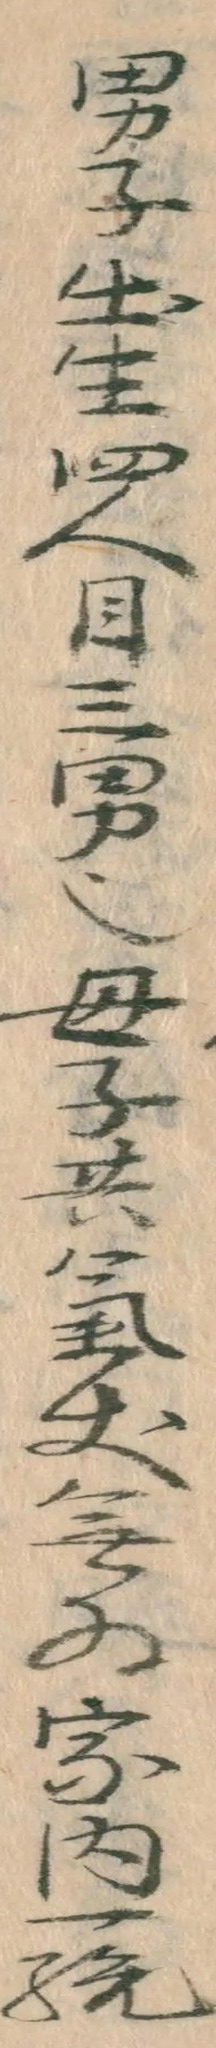男子出生四人目三男也母子共氣丈無為家内一統
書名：賀茂社記録. 第63冊
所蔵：国立国会図書館 National Diet Library, JAPAN
